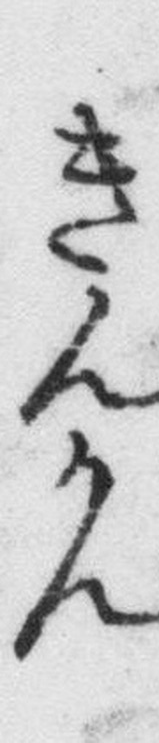きんなん
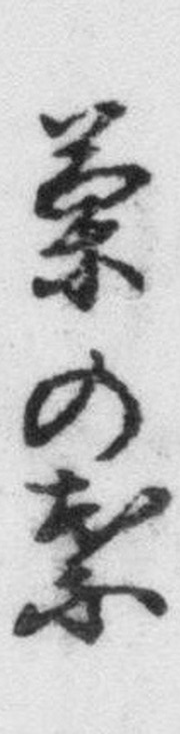茶の葉
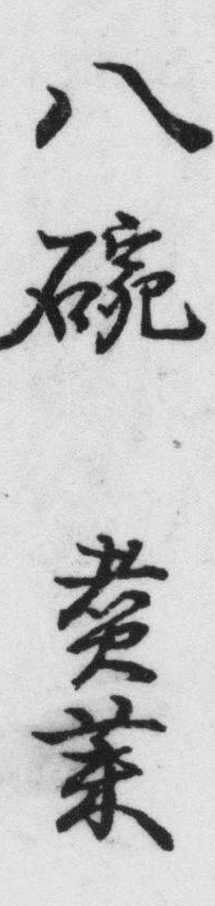八碗煮菜
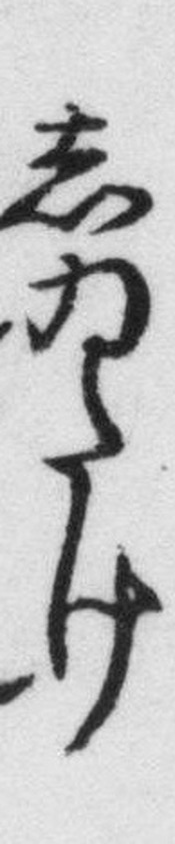志ゐたけ
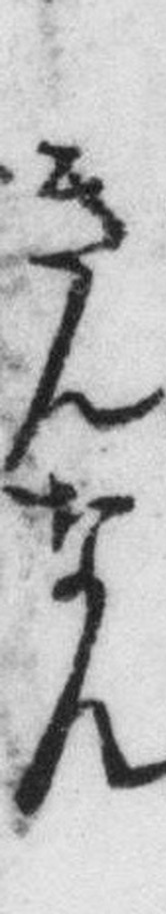きんなん
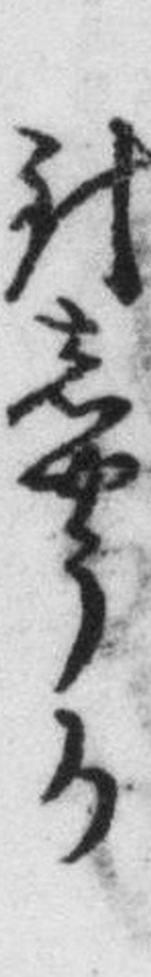針志やうか
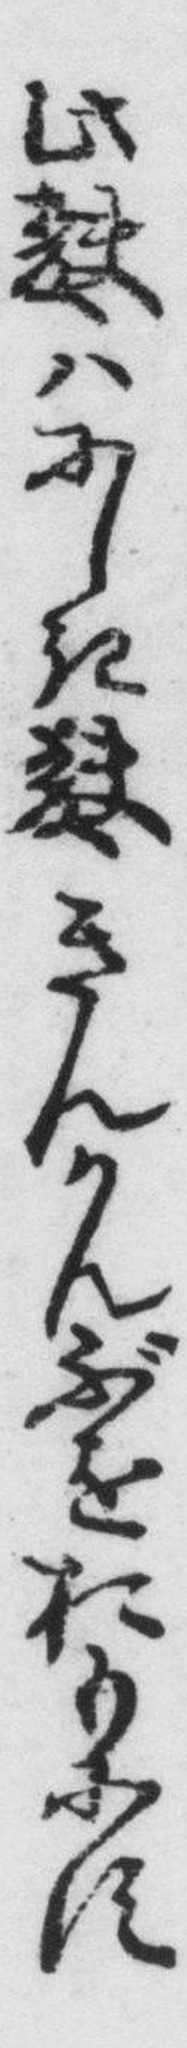此麩は尓し起麩きんかんぶを於も尓須

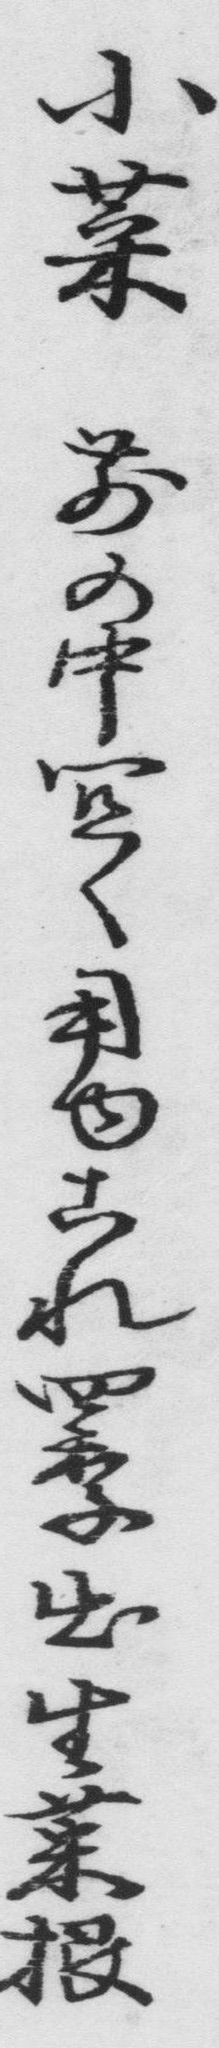小菜前の中宜く用ゆ小古れ四季出生菜根
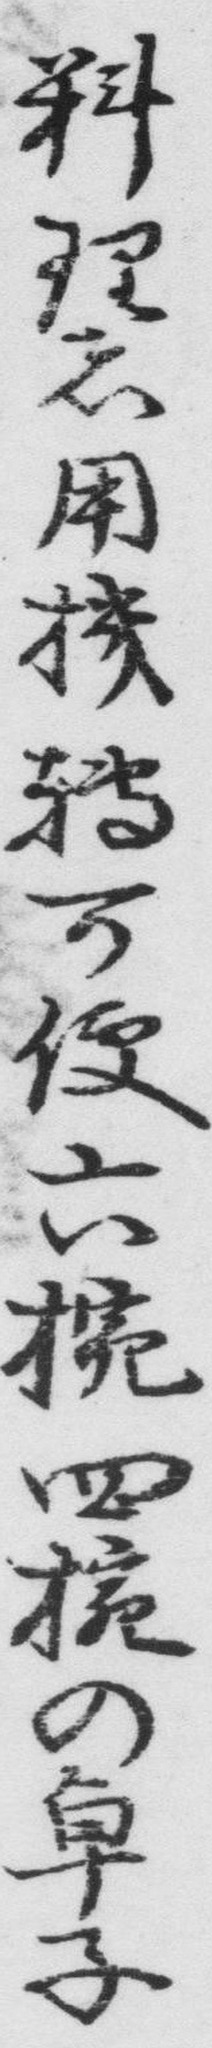料理者用機転万便六椀四椀の卓子
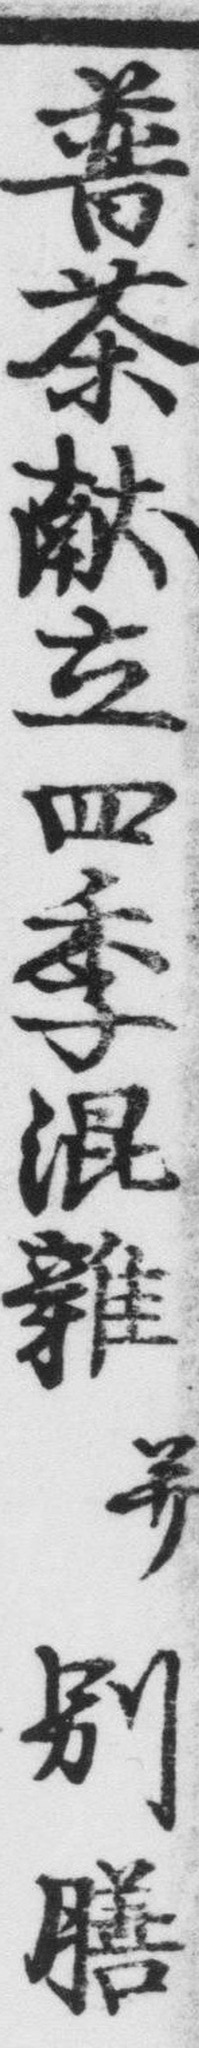普茶献立四季混雑幷別膳

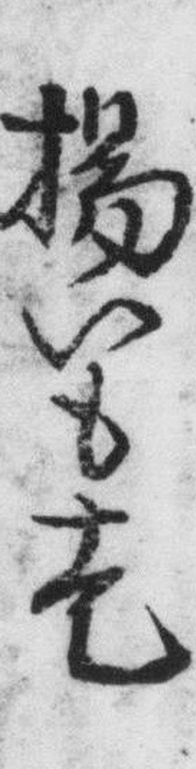揚いも巻
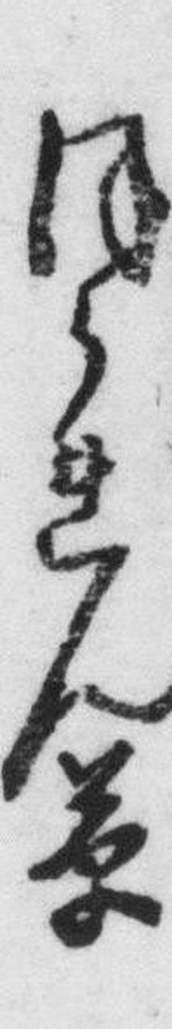ほう連ん草
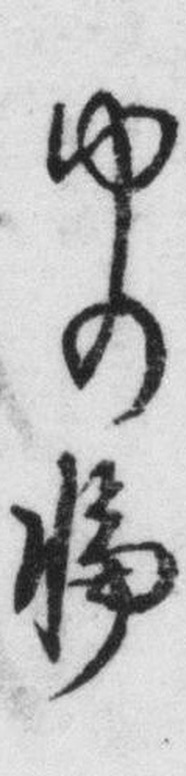ゆの輪
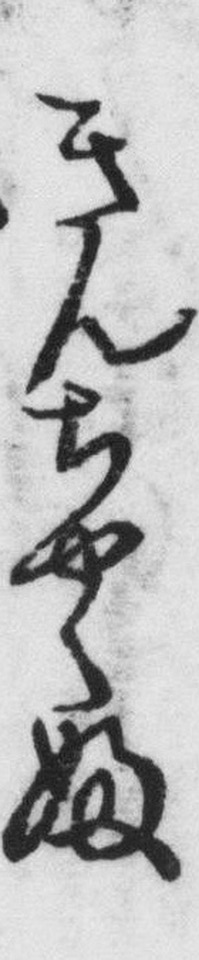きんちやく婦
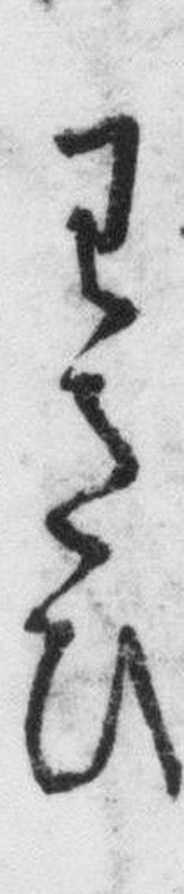わたひ
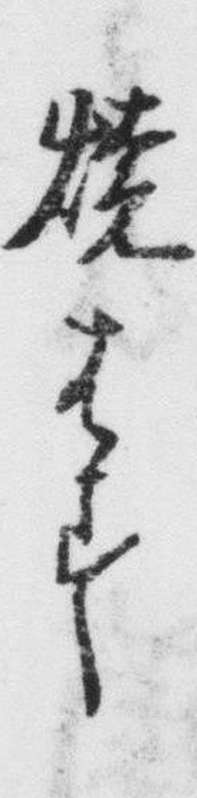焼は春
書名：普茶料理抄
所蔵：大阪府立大学学術情報センター 国文学研究資料館
